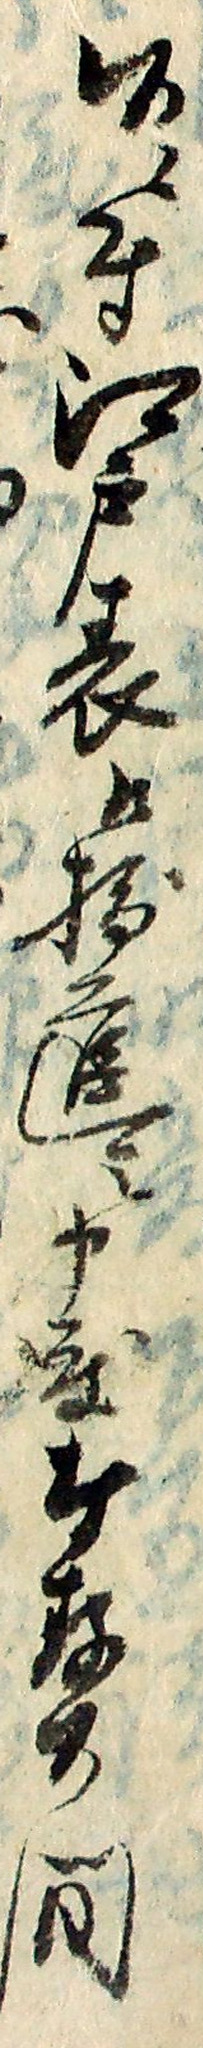候に付江戸表え指遣し申度奉存候間
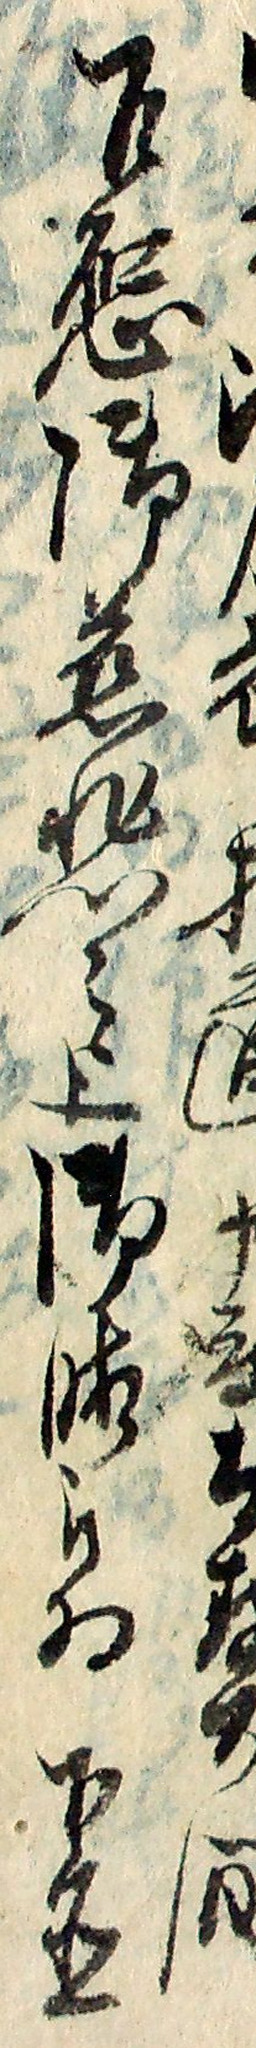乍恐御慈悲之上御暇被為下置
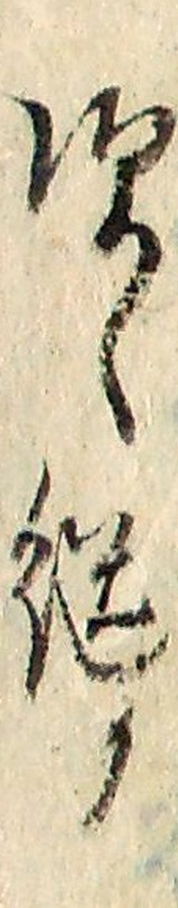次へ継く
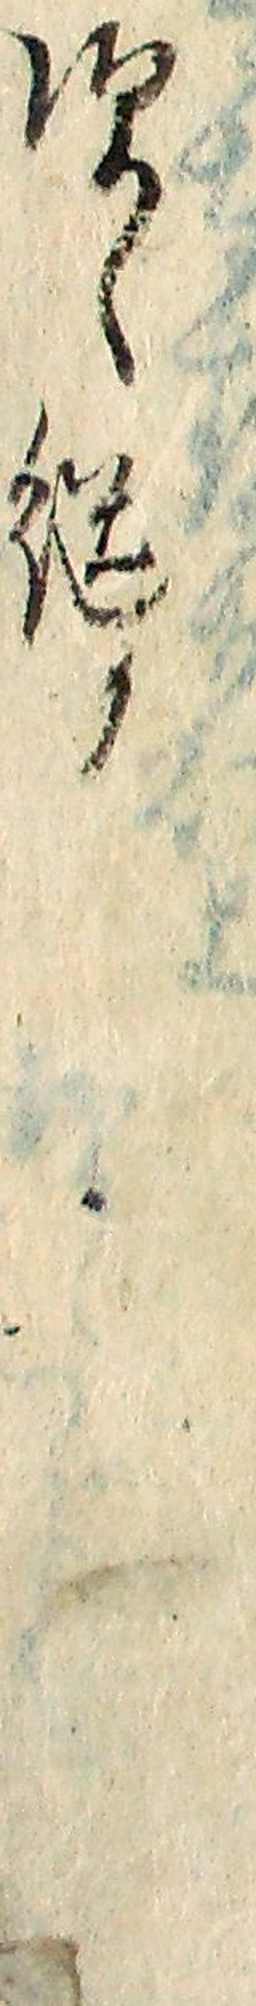次へ継く

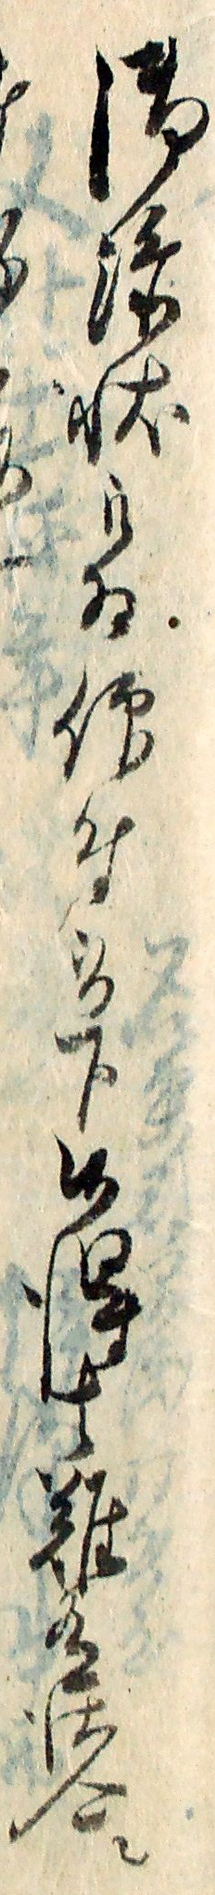御添状被為仰付被下候得は難有仕合に
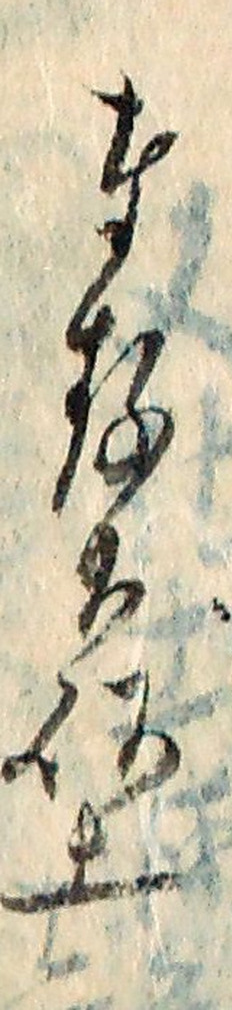奉存候以上
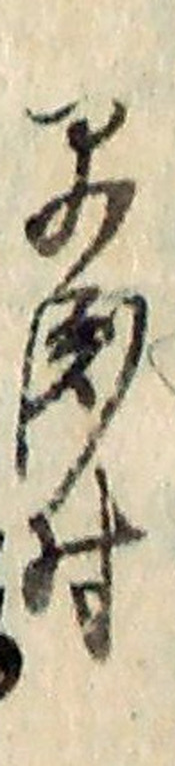早淵村
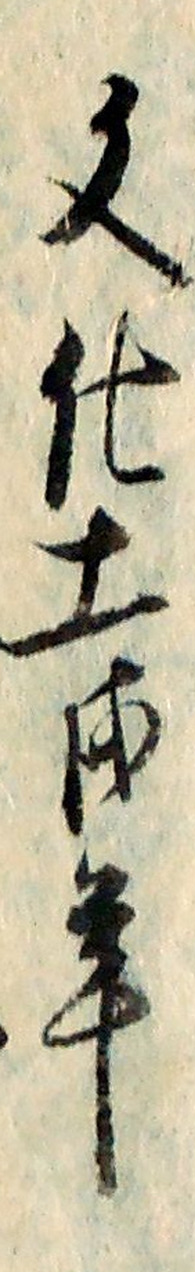文化十一戌年
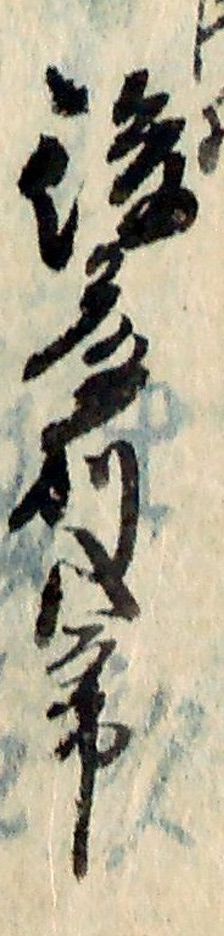後藤利八郎
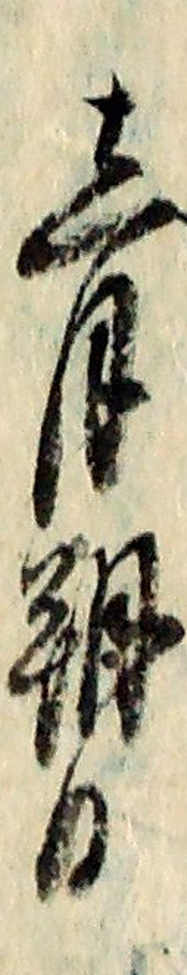十二月朔日
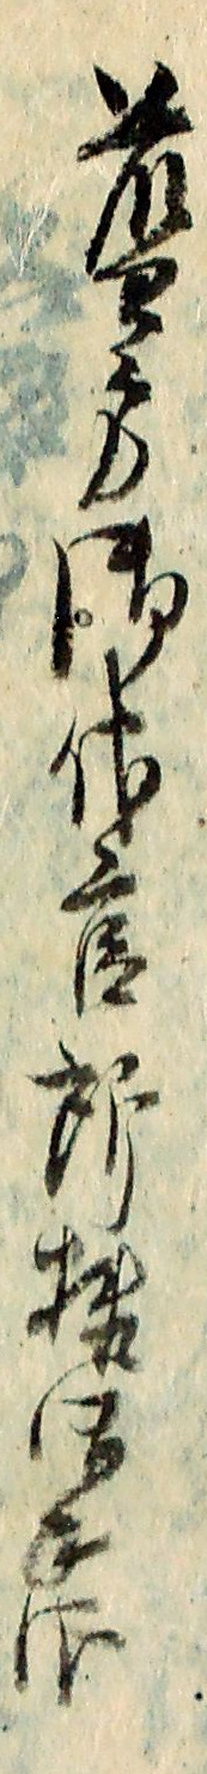藍方御代官所様御手代
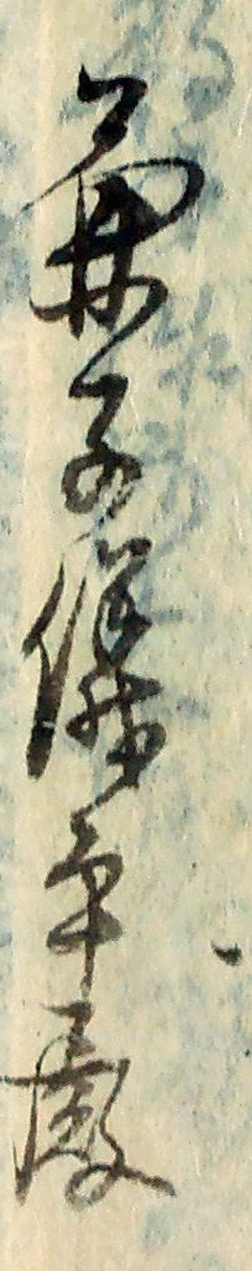兼子儀平殿
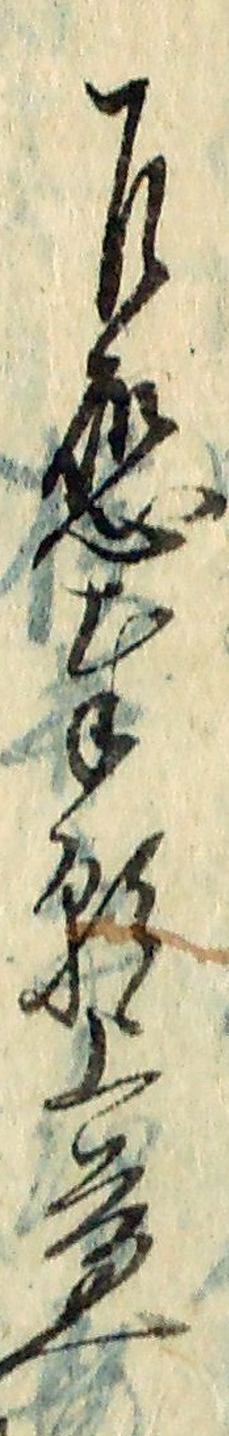乍恐奉願上覚
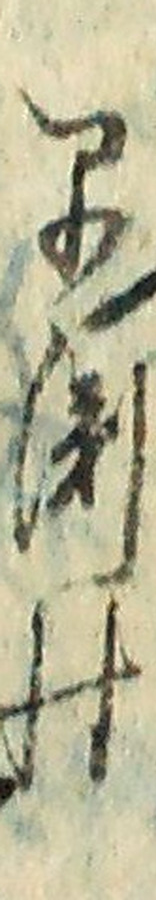早淵村
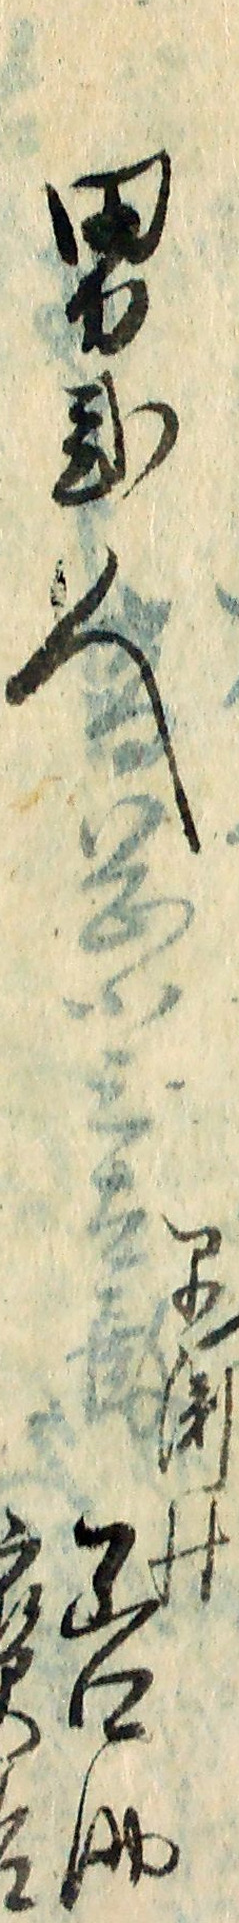一男弐人善助
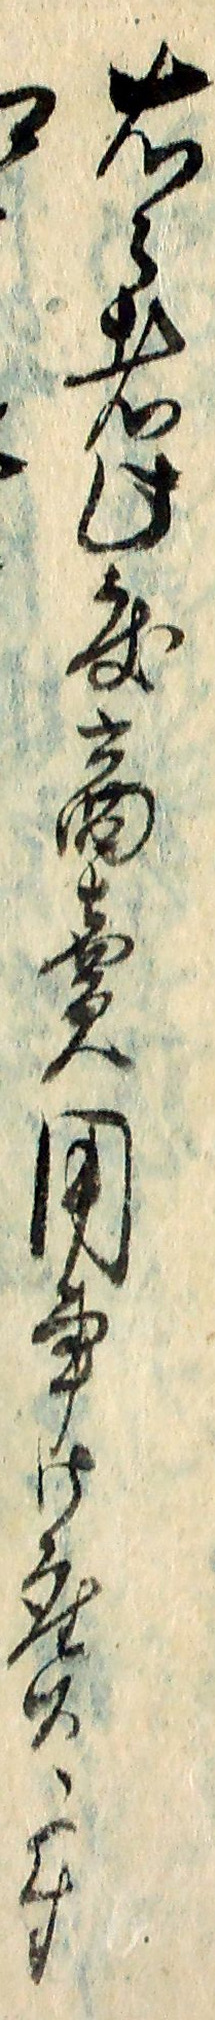右之者此度商売用事御座候に付
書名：諸御願書控(後藤氏壱番）
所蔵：鳴門教育大学 Naruto University of Education
